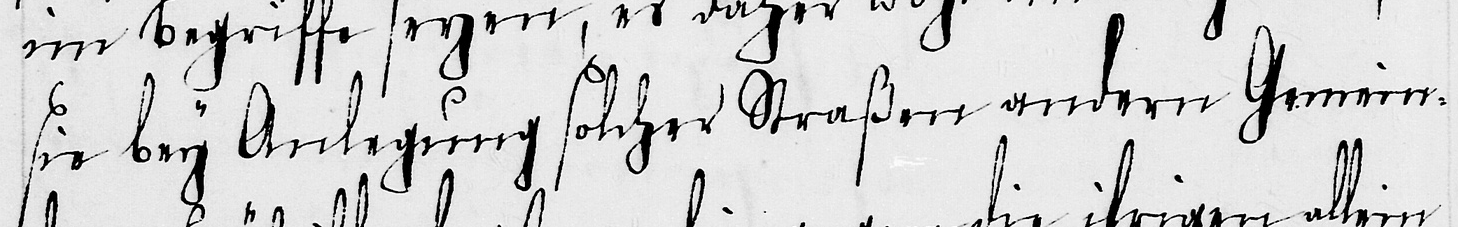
sie bey Anlegung solcher Straßen andern Gemein¬
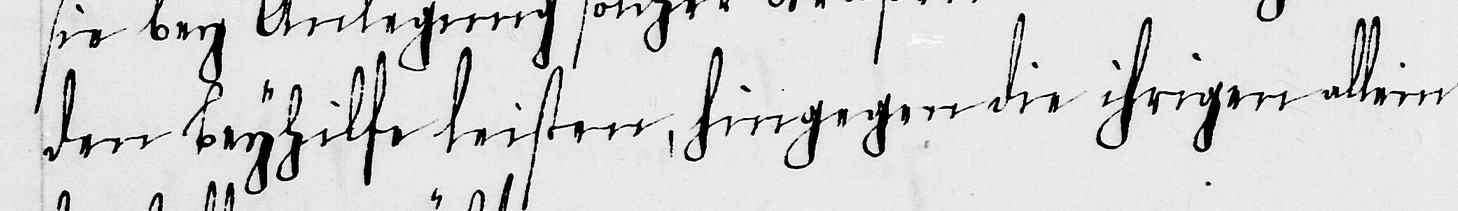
den Beyhilfe leisten, hingegen die ihrigen allein
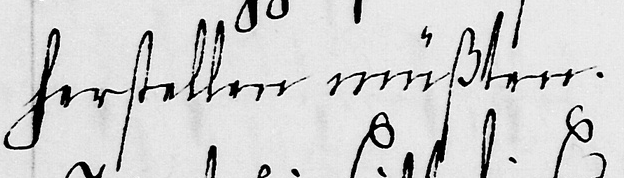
herstellen müßten.
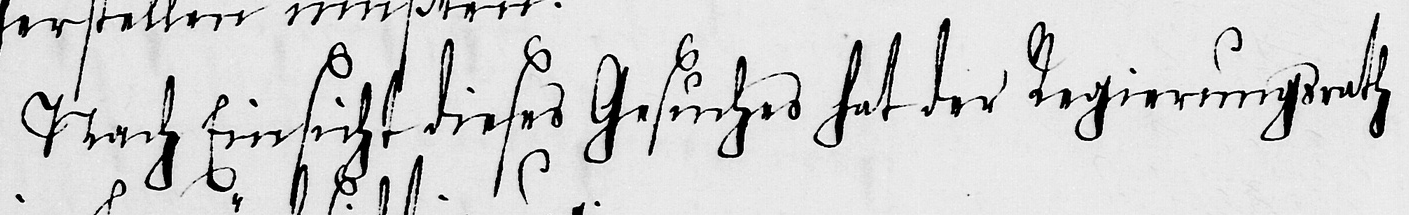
Nach Einsicht dieses Gesuches hat der Regierungsrath
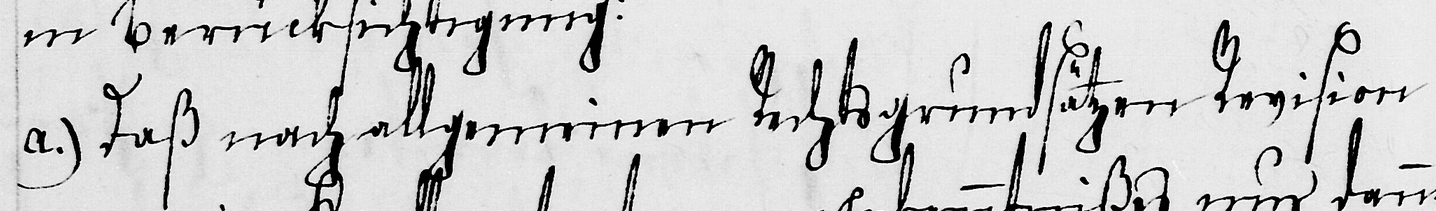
a.) Daß nach allgemeinen Rechtsgrundsätzen Revision
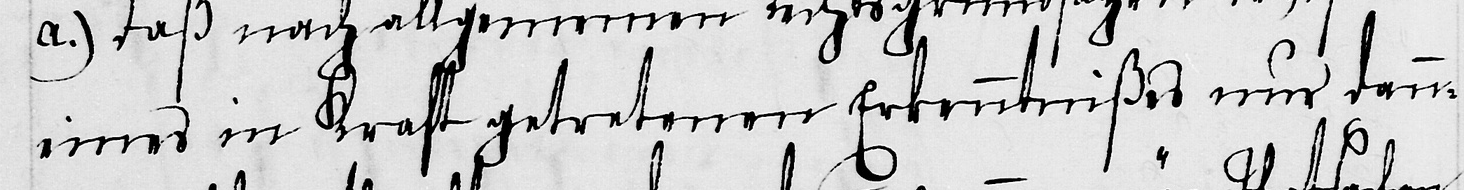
eines in Kraft getretenen Erkenntnißes nur dann¬
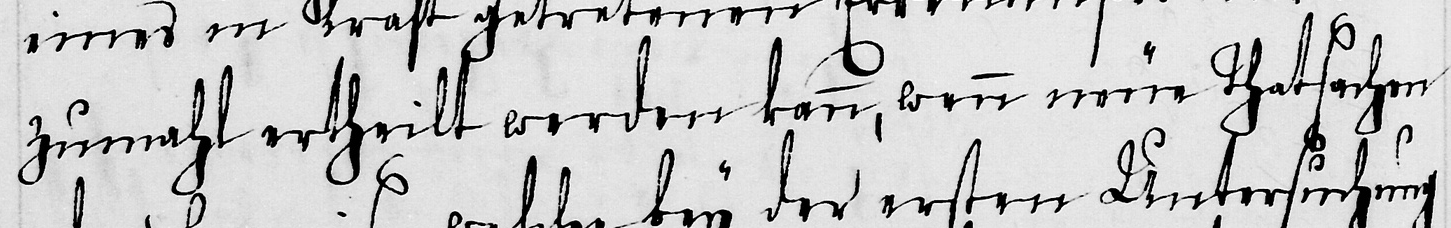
zumahl ertheilt werden kann, wenn neue Thatsachen
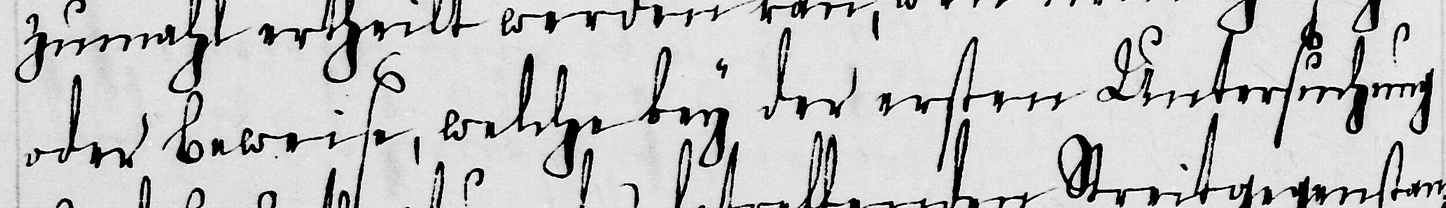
oder Beweise, welche bey der ersten Untersuchung
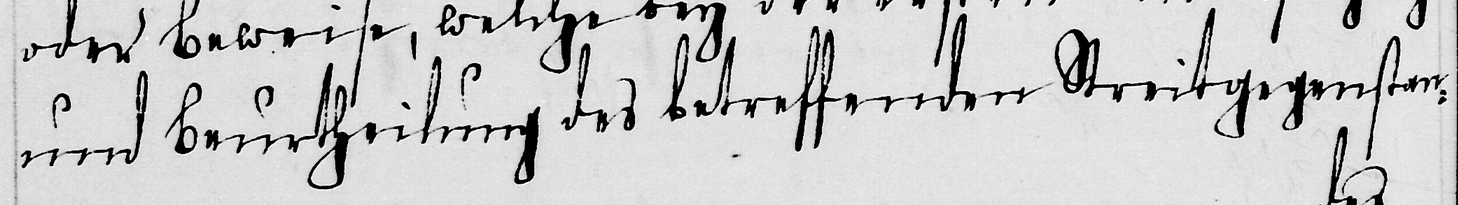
und Beurtheilung des betreffenden Streitgegenstan-
